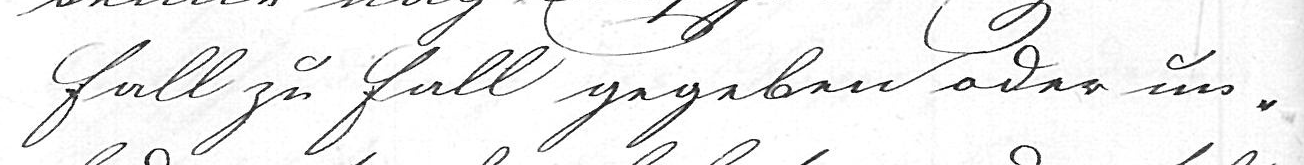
Fall zu Fall gegeben oder un-
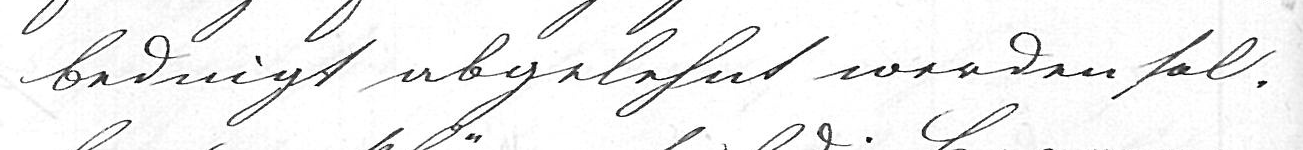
bedingt abgelehnt werden sol-
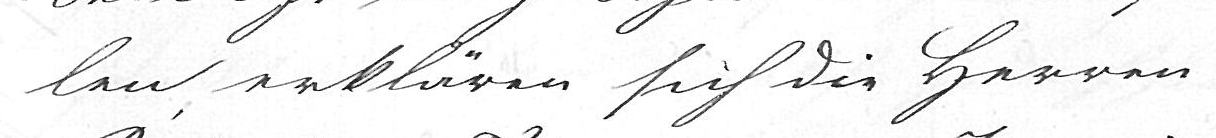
len erklären sich die Herren:
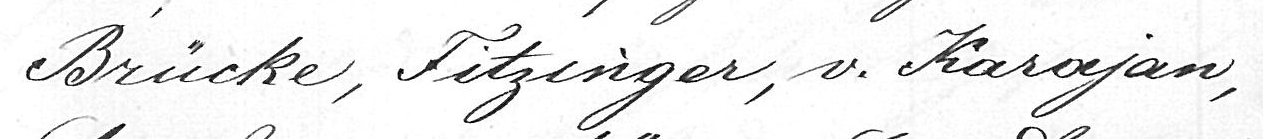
Brücke, Fitzinger, v. Karajan,
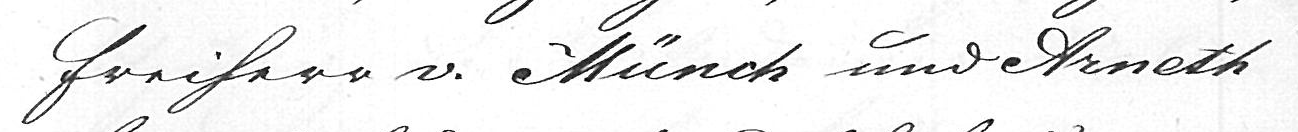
Freiherr v. Münch und Arneth
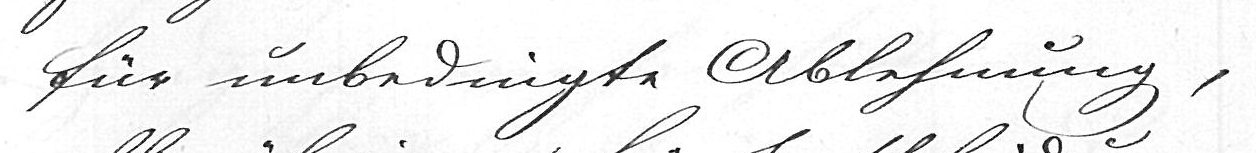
für unbedingte Ablehnung,
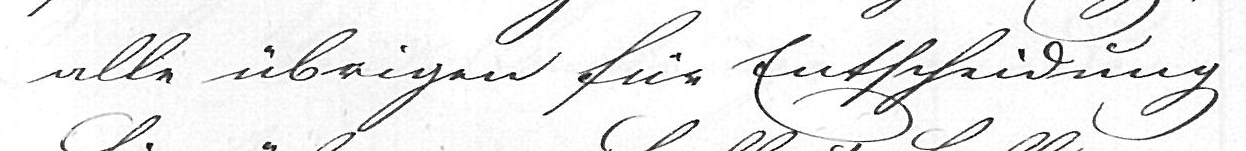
alle übrigen für Entscheidung
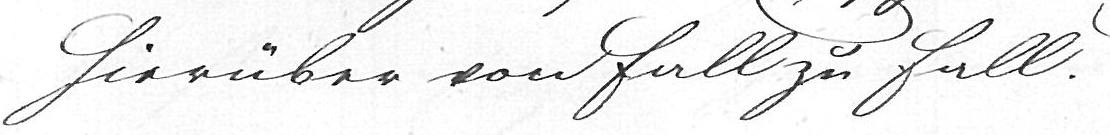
hierüber von Fall zu Fall.
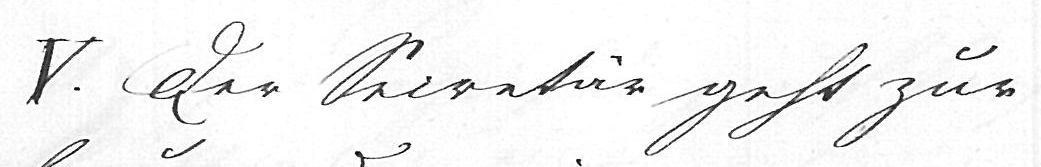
V. Der Secretär geht zur
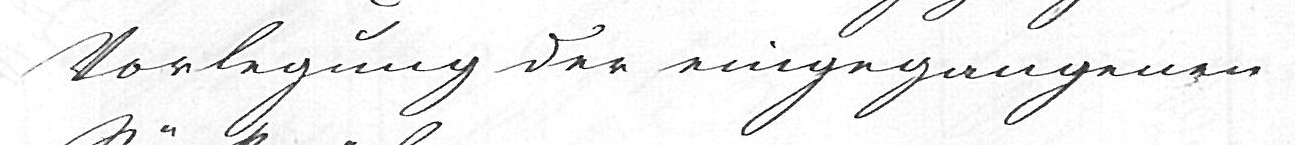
Vorlegung der eingegangenen
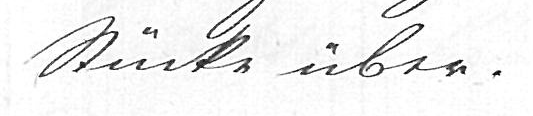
Stücke über.
